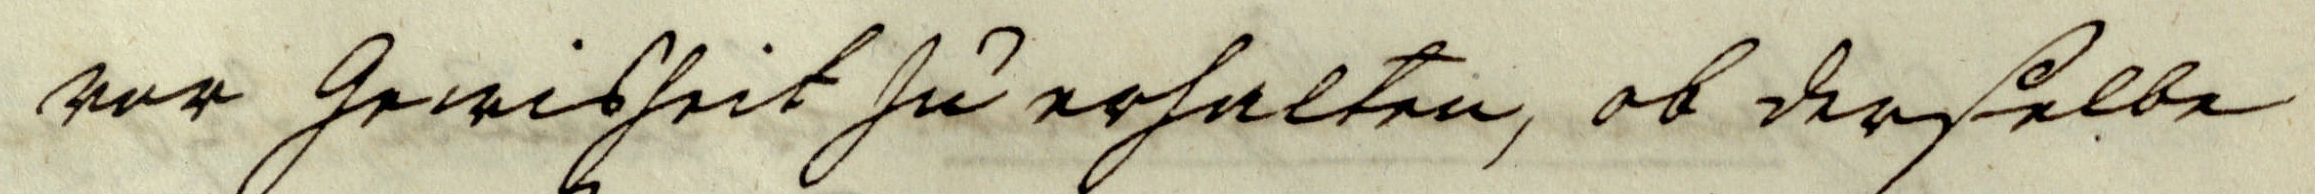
vor Gewisheit zu erhalten, ob derselbe
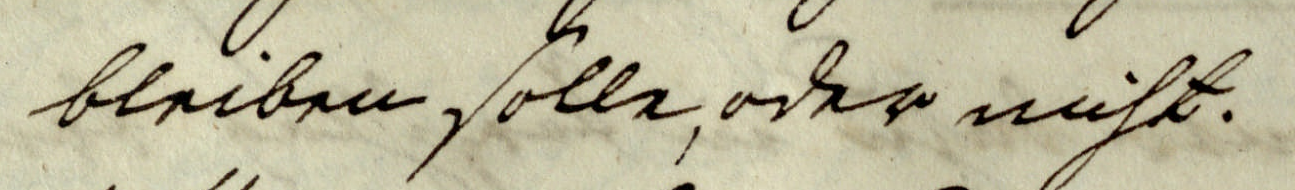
bleiben solle, oder nicht.
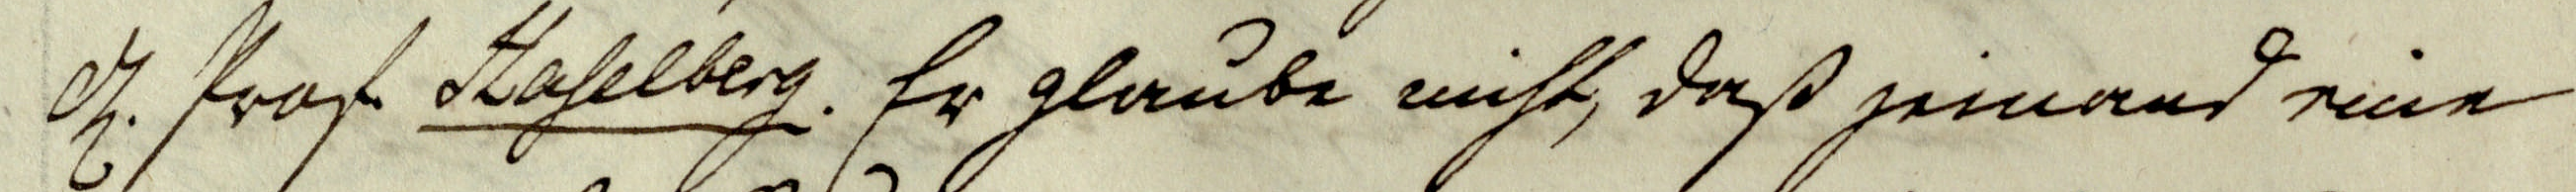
dh. Prof. Haselberg. Er glaube nicht, daß jemand eine
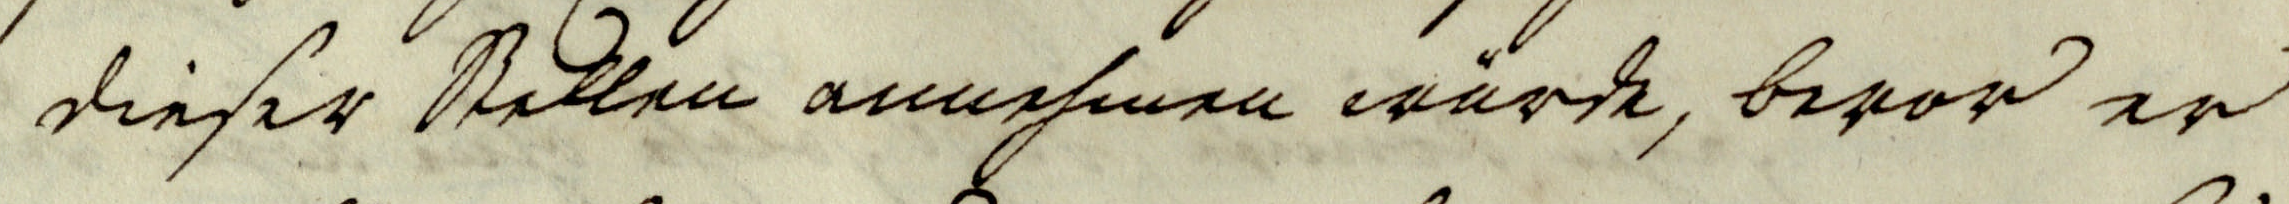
dieser Stellen annehmen würde, bevor er
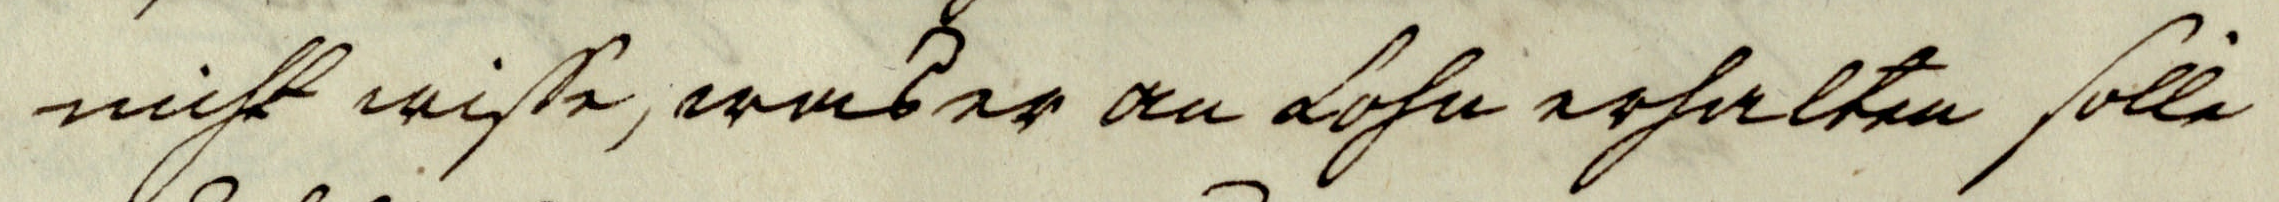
nicht wisse, was er an Lohn erhalten solle
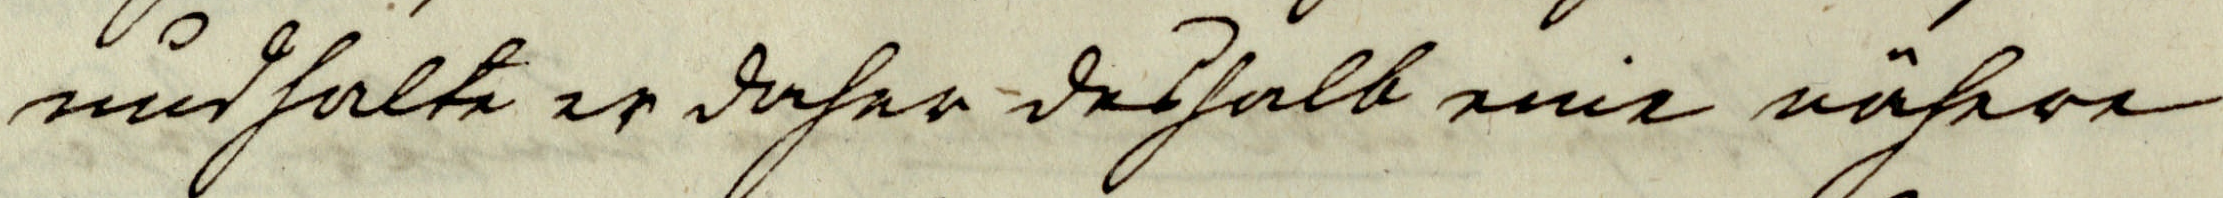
und halte er daher deshalb eine nähere
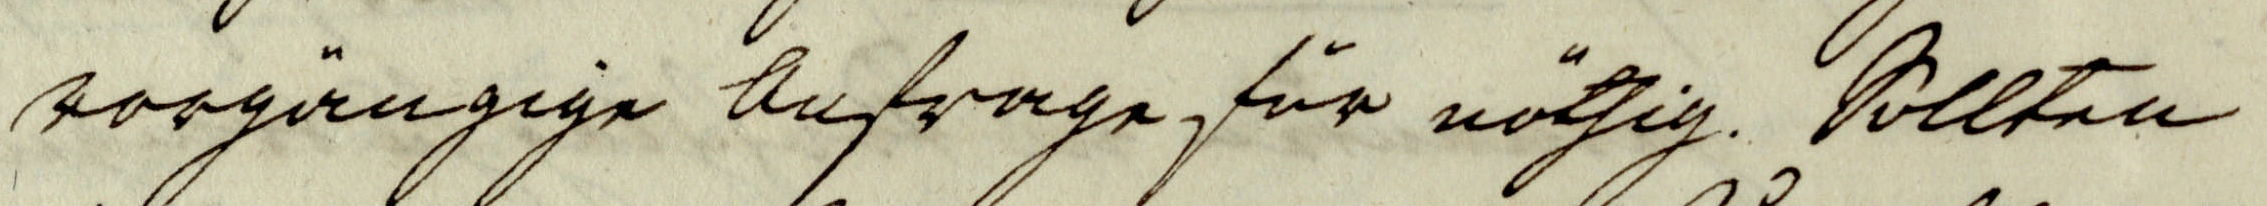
vorgängige Anfrage für nöthig. Sollten
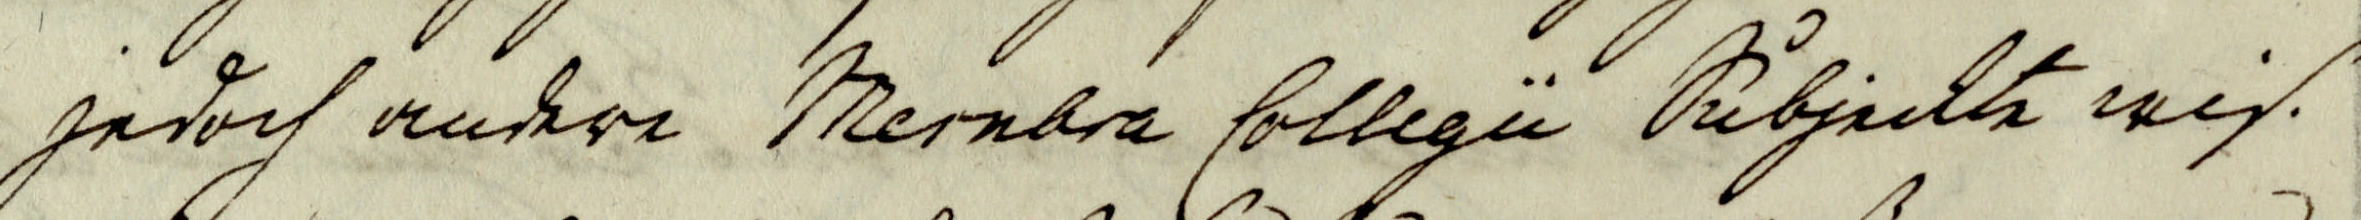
jedoch andere Membra Collegii Subjecte wis¬
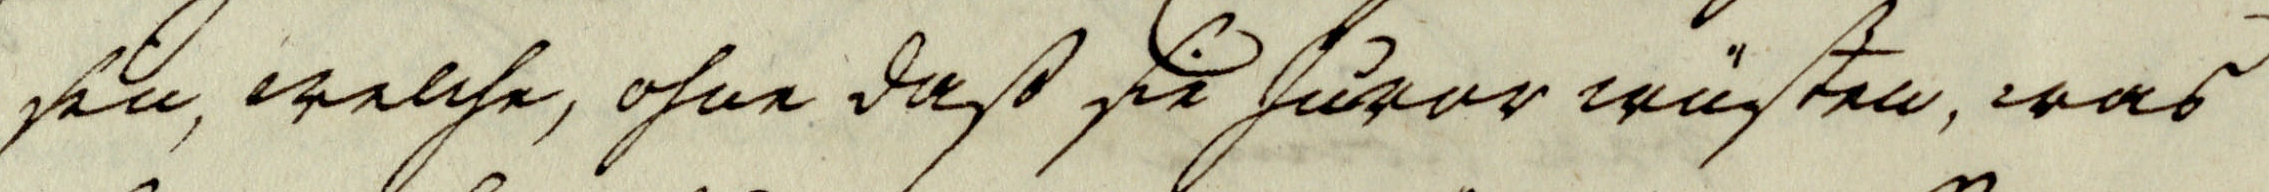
sen, welche, ohne daß sie zuvor wüßten, was
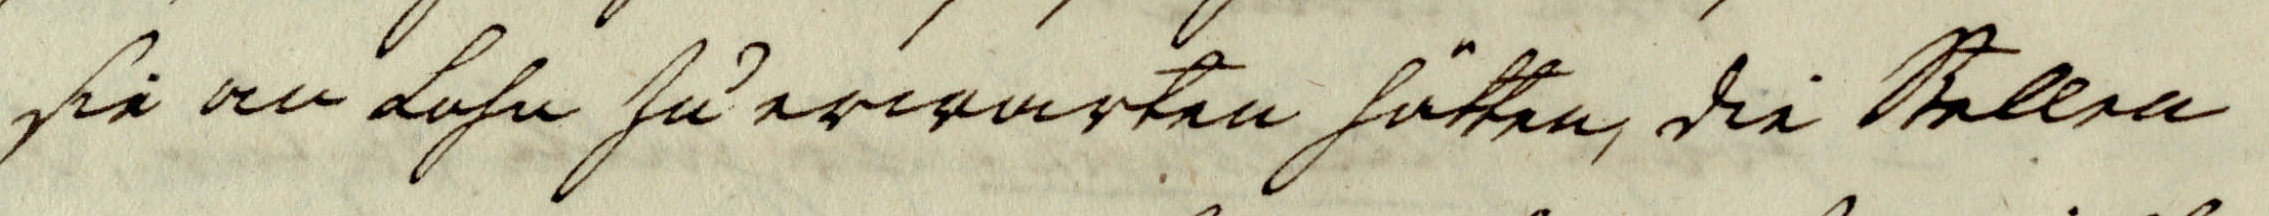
sie an Lohn zu erwarten hätten, die Stellen
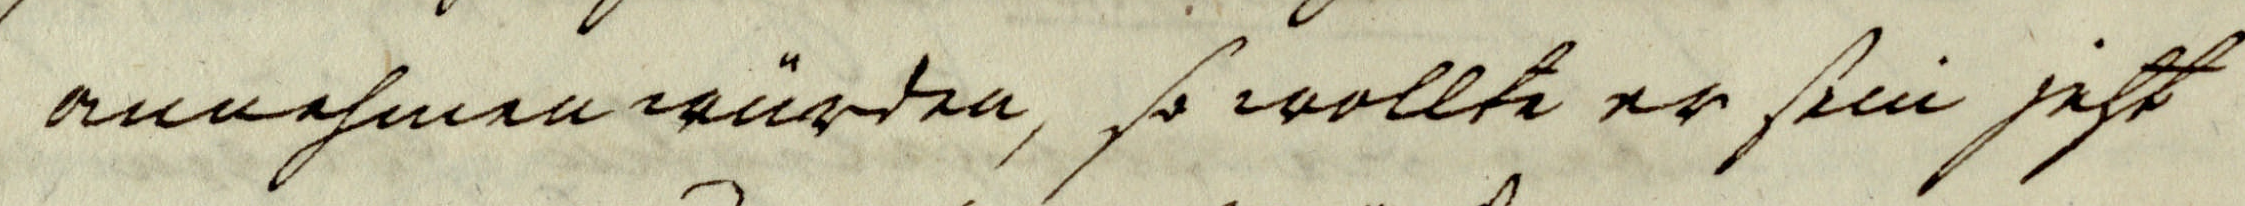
annehmen würden, so wollte er sein jetzt
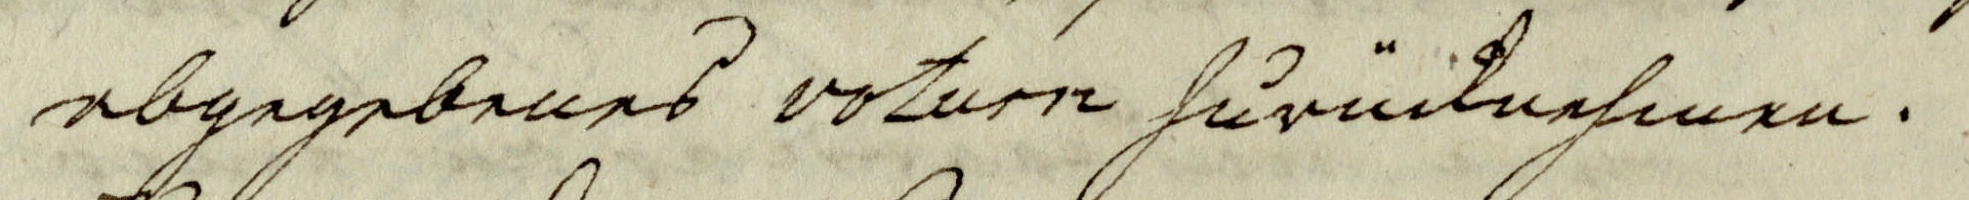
abgegebenes votum zurücknehmen.
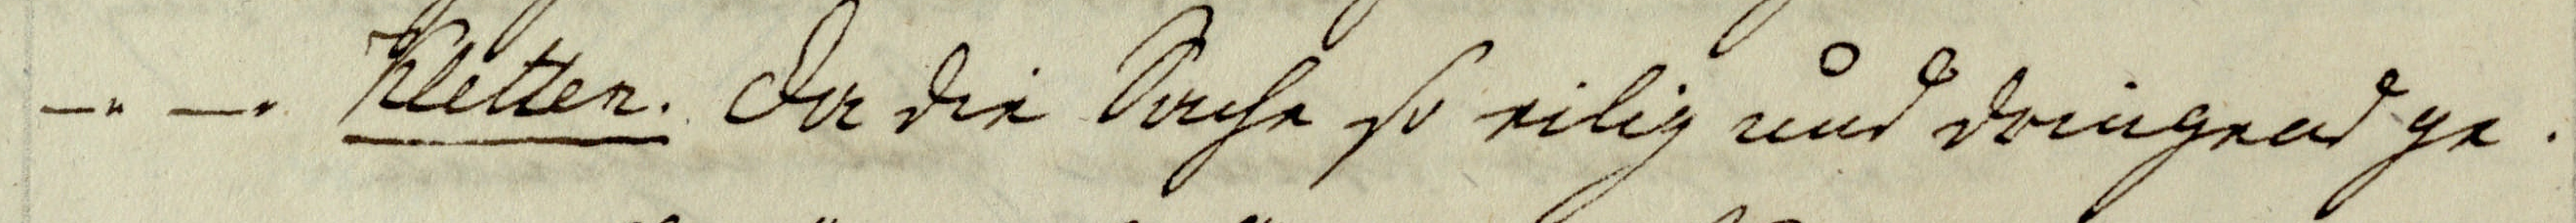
— " — . Kletten. Da die Sache so eilig und dringend ge¬
